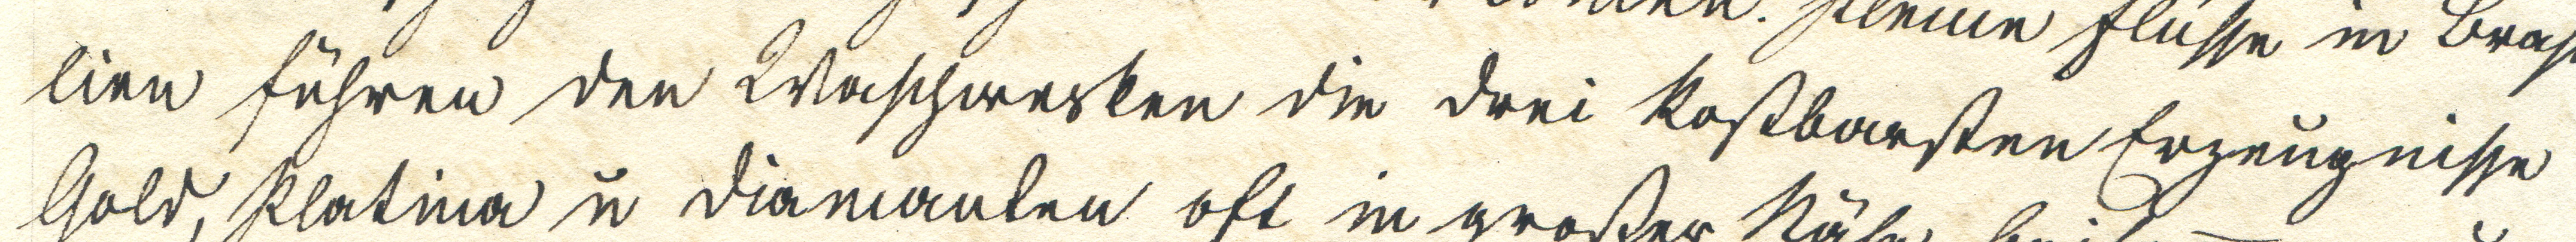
lien führen den Waschwerken die drei kostbarsten Erzeugnisse
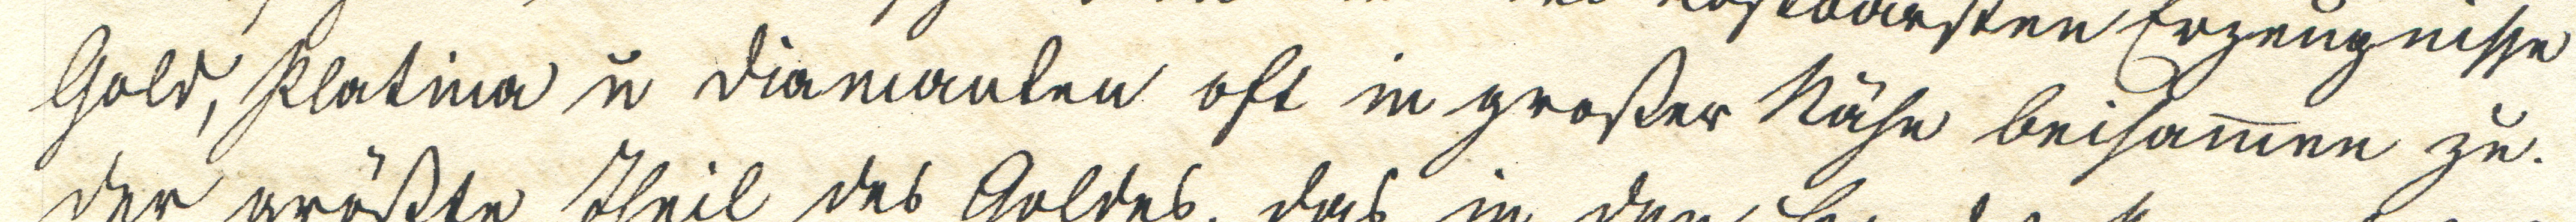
Gold, Platin u Diamanten oft in großer Nähe beisam̃en zu.
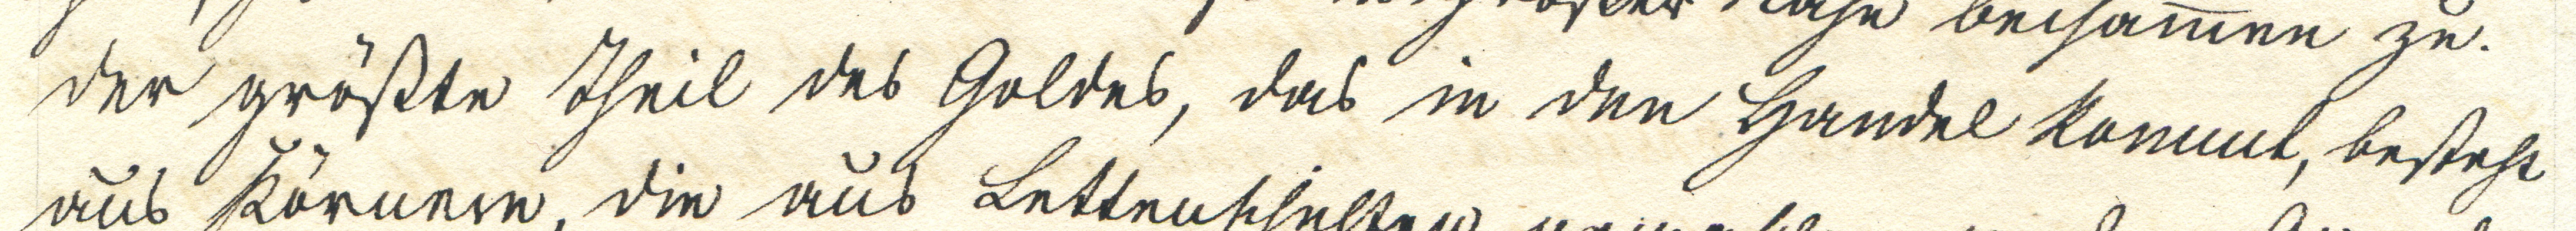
Der größte Theil des Goldes, das in den Handel kommt, besteht
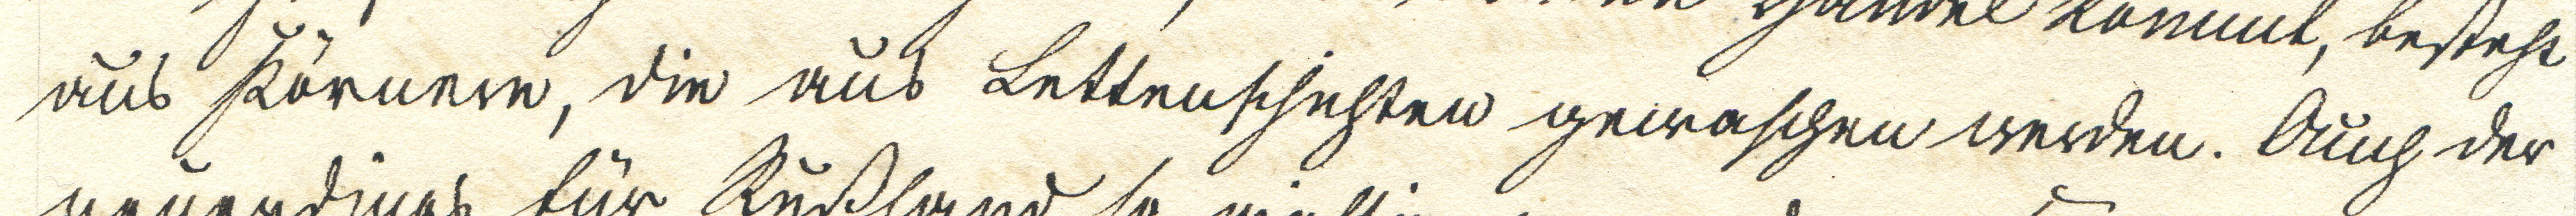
aus Körnern, die aus Lettenschichten gewaschen werden. Auch der
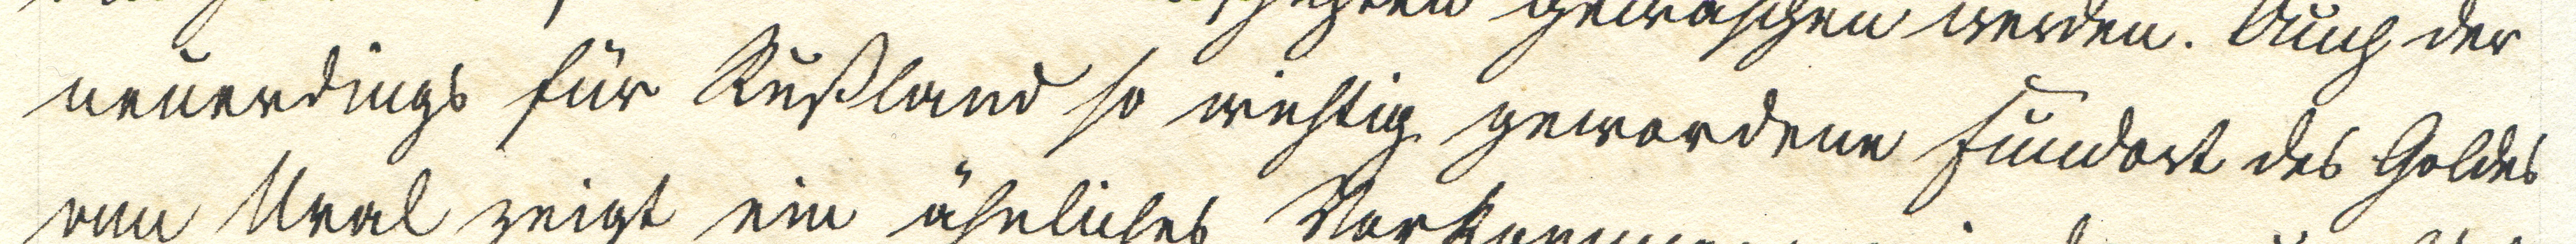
neuerdings für Rußland so wichtig gewordene Fundort des Goldes
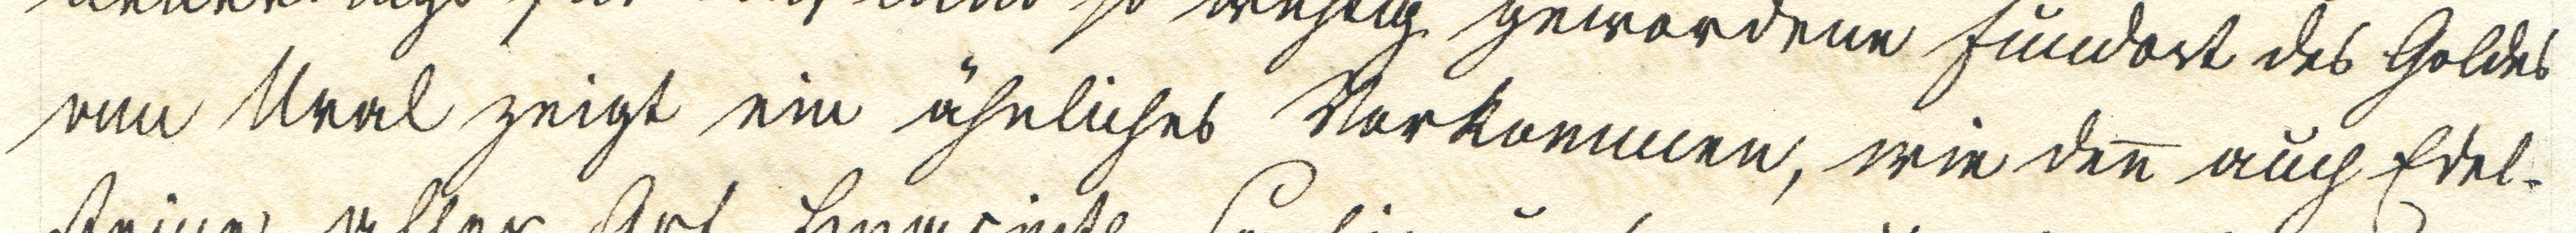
am Ural zeigt ein ähnliches Vorkommen, wie deñ auch Edel-
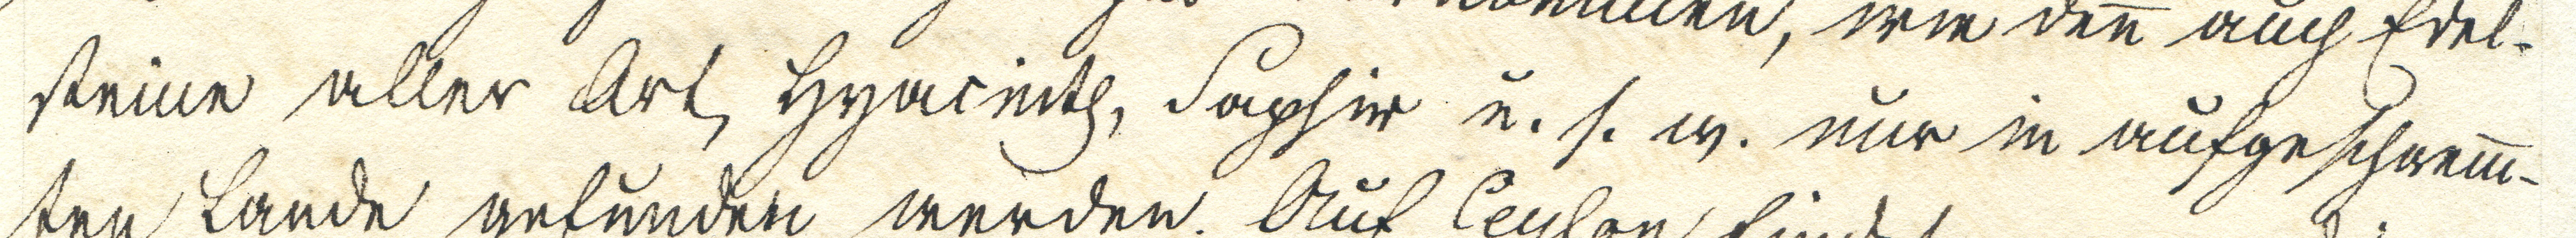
steine aller Art, Hyacinth, Saphir u. s. w. nur aufgeschwem̃-
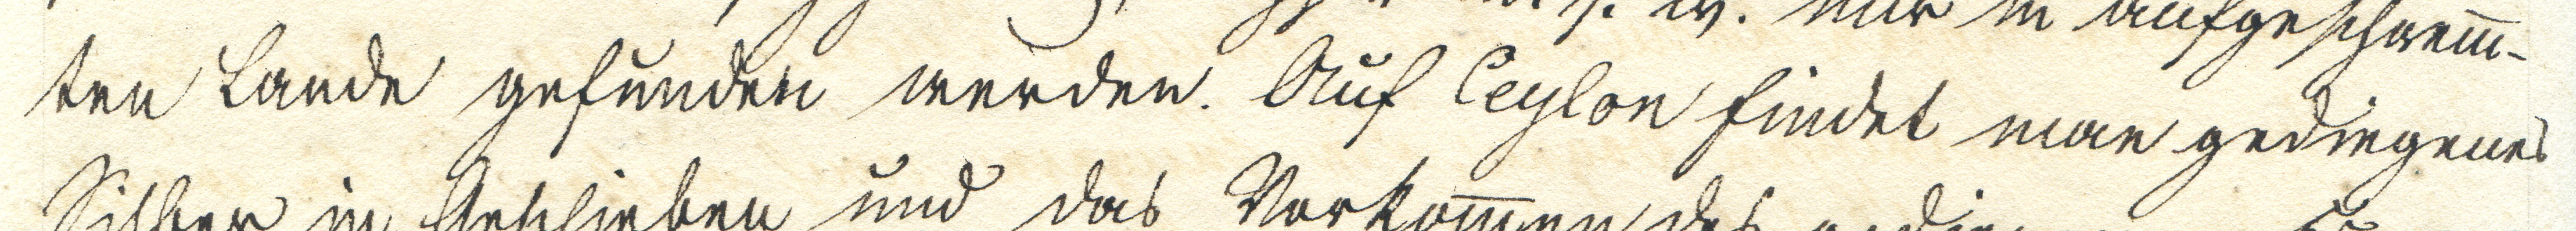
ten Lande gefunden werden. Auf Ceylon findet man gediegenes
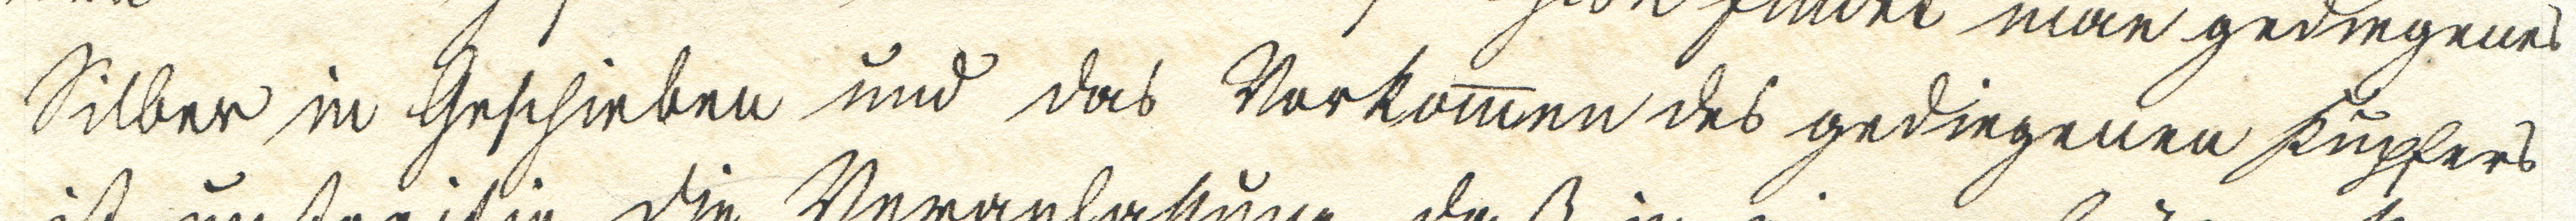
Silber in Geschieben und das Vorkom̃en des gediegenen Kupfers
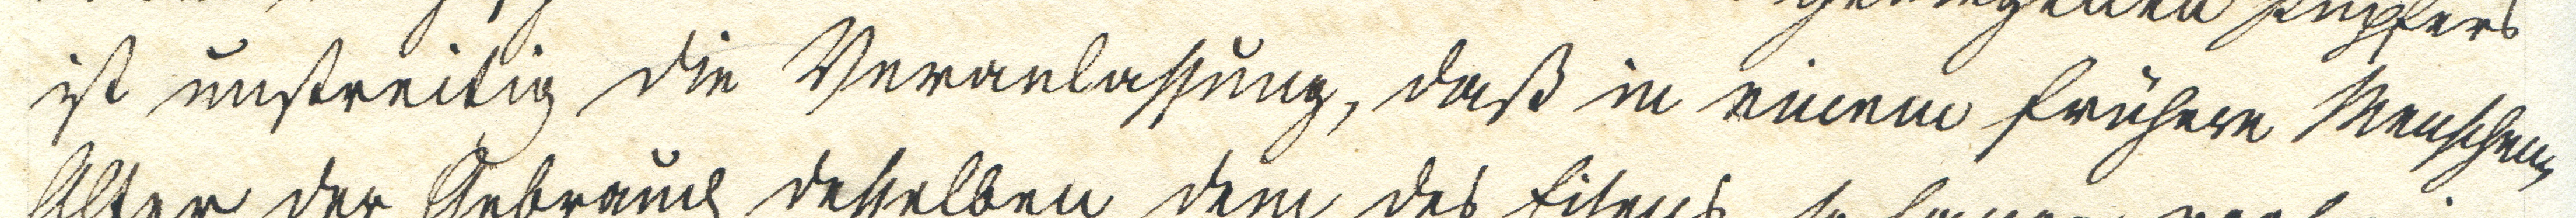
ist unstreitig die Veranlassung, daß in einem frühern Menschen-
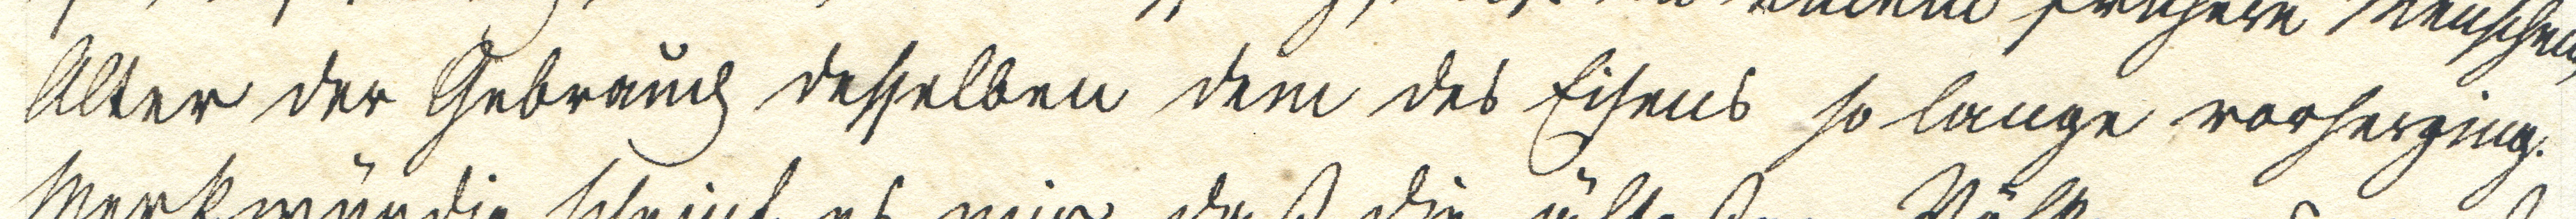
Alter der Gebrauch desselben dem des Eisens so lange vorherging.
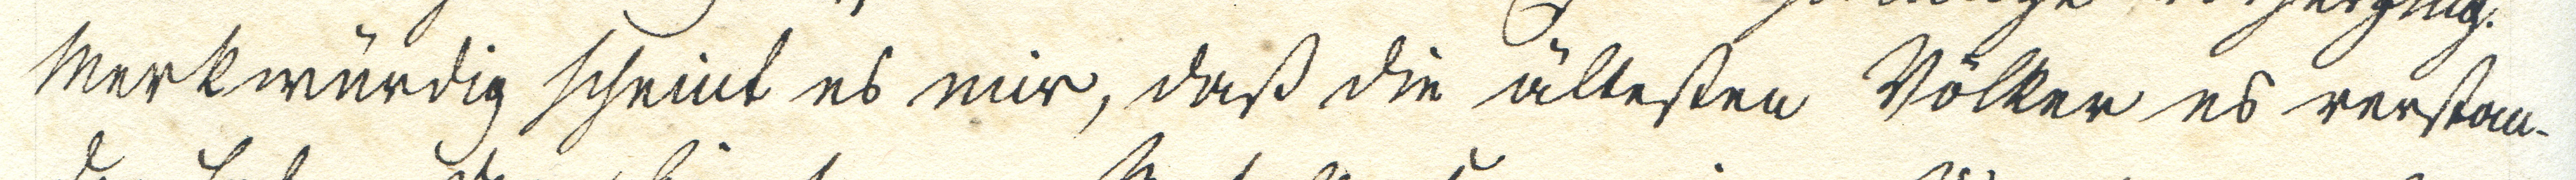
Merkwürdig scheint es mir, daß die ältesten Völker es verstan-
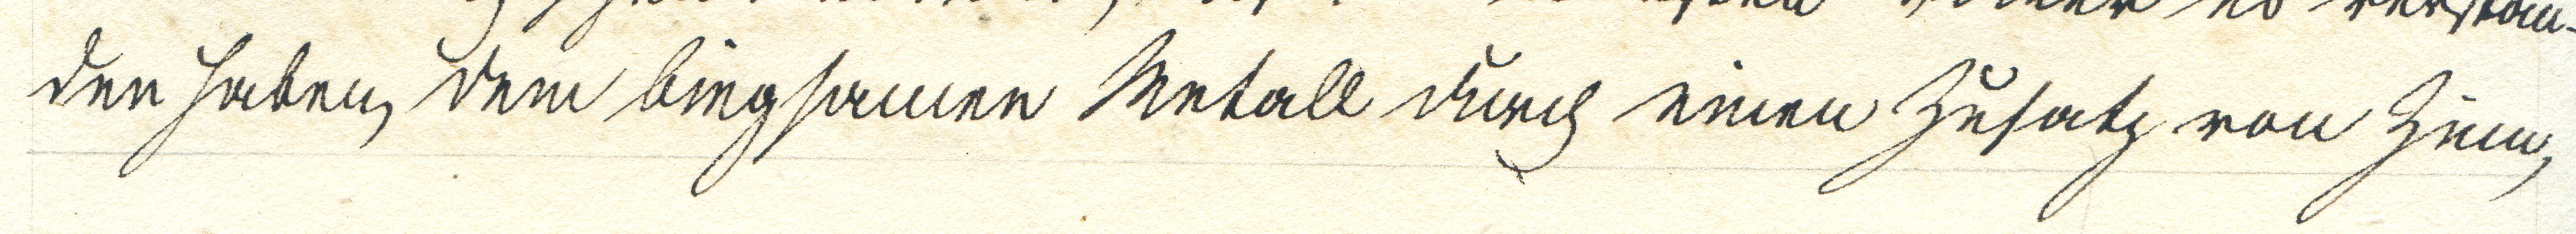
den haben, dem biegsamen Metall durch einen Zusatz von Zinn,
